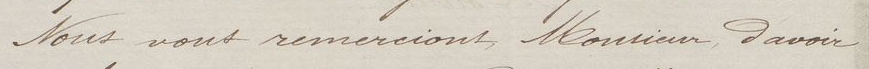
Nous vous remercions, Monsieur, d'avoir
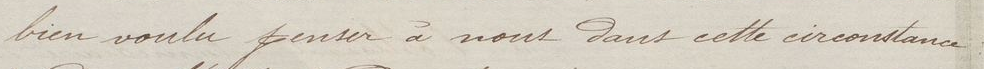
bien voulu penser à nous dans cette circonstance
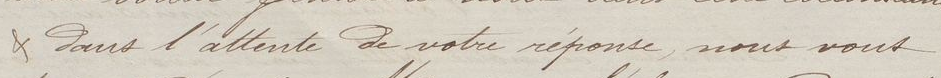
& dans l'attente de votre réponse, nous vous
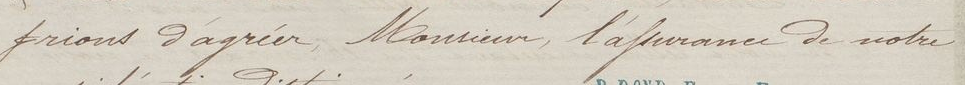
prions d'agréer, Monsieur, l'assurance de votre
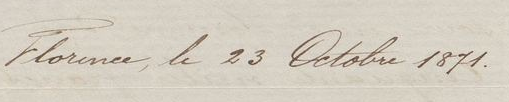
Florence, le 23 Octobre 1871.
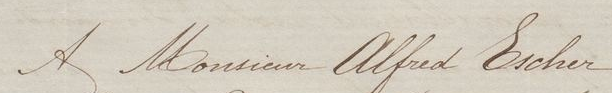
A Monsieur Alfred Escher
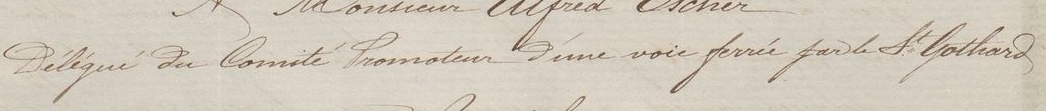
Délégué du Comité Promoteur d'une voie ferrée par le St Gothard
